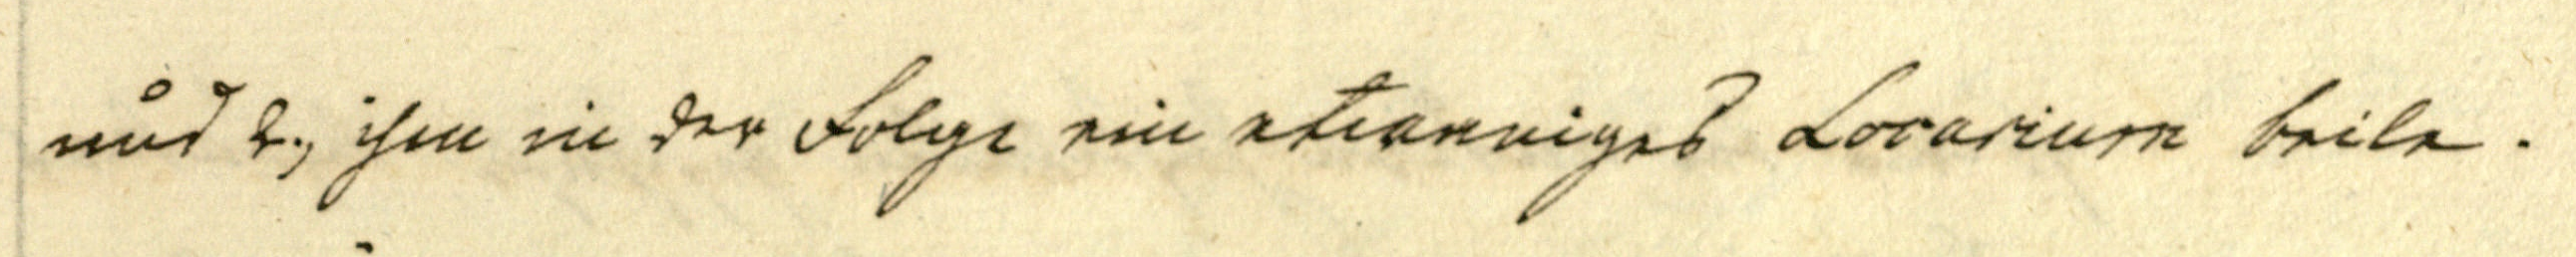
und 2., ihm in der Folge ein etwaniges Locarium beile¬
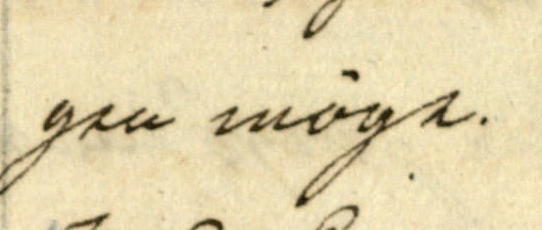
gen möge.
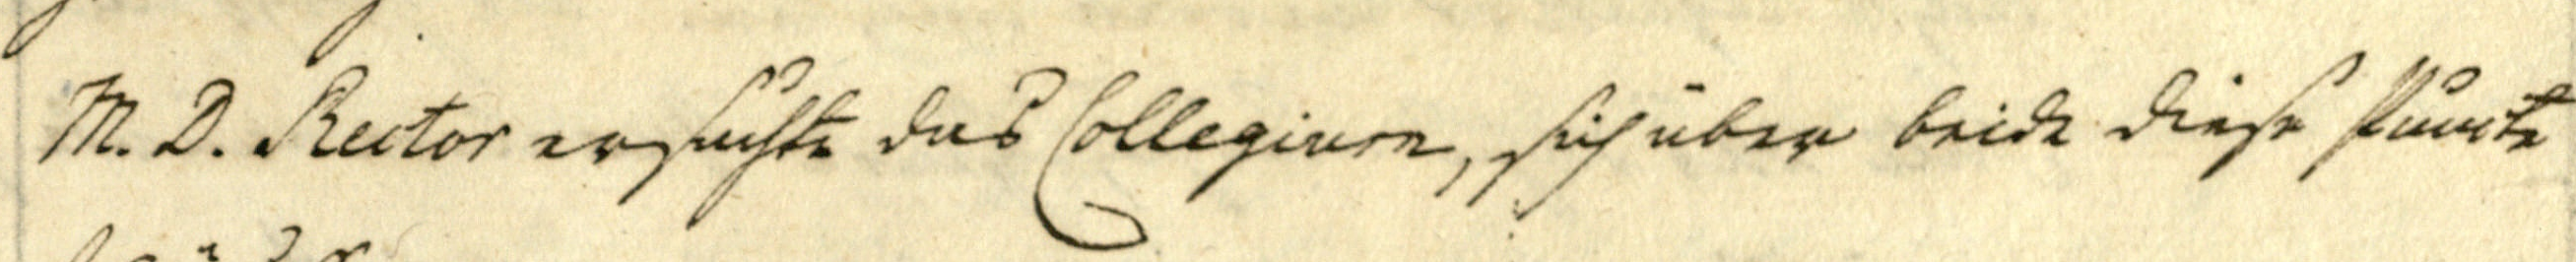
M. D. Rector ersuchte das Collegium, sich über beide diese Puncte
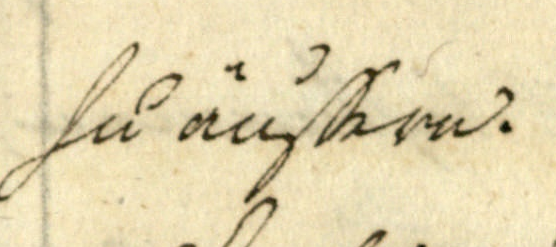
zu äussern.
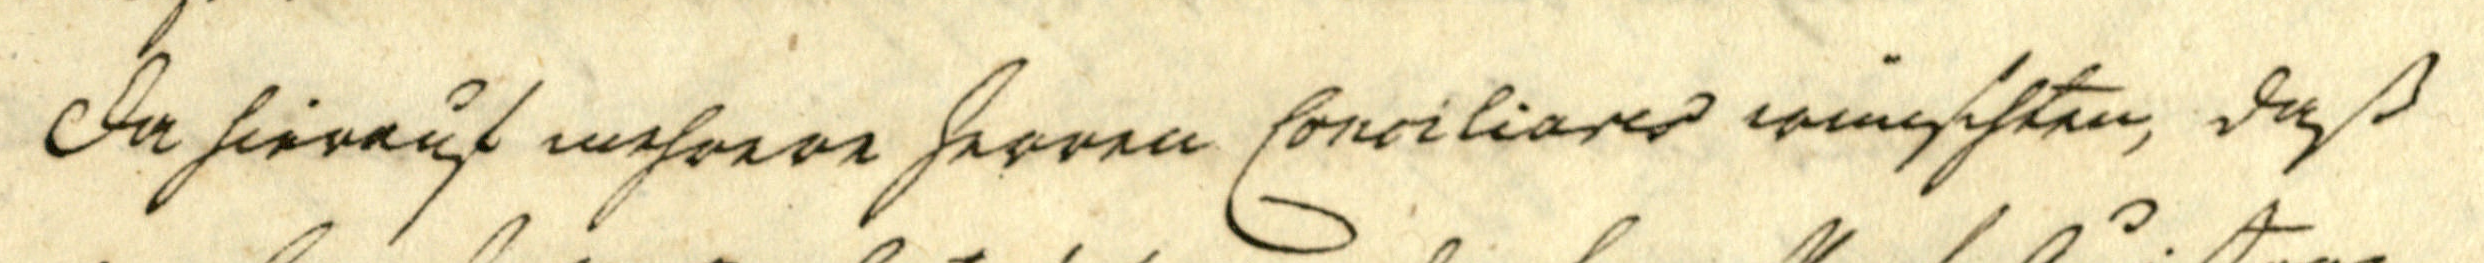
Da hierauf mehrere Herren Conciliares wünschten, daß
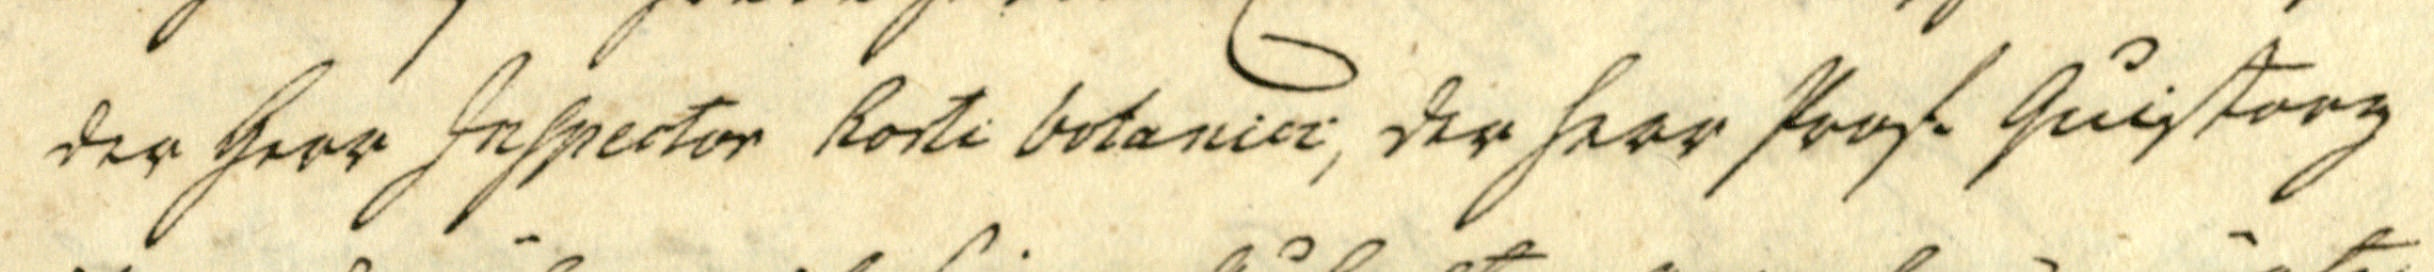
der Herr Inspector horti botanici, der Herr Prof. Quistorp
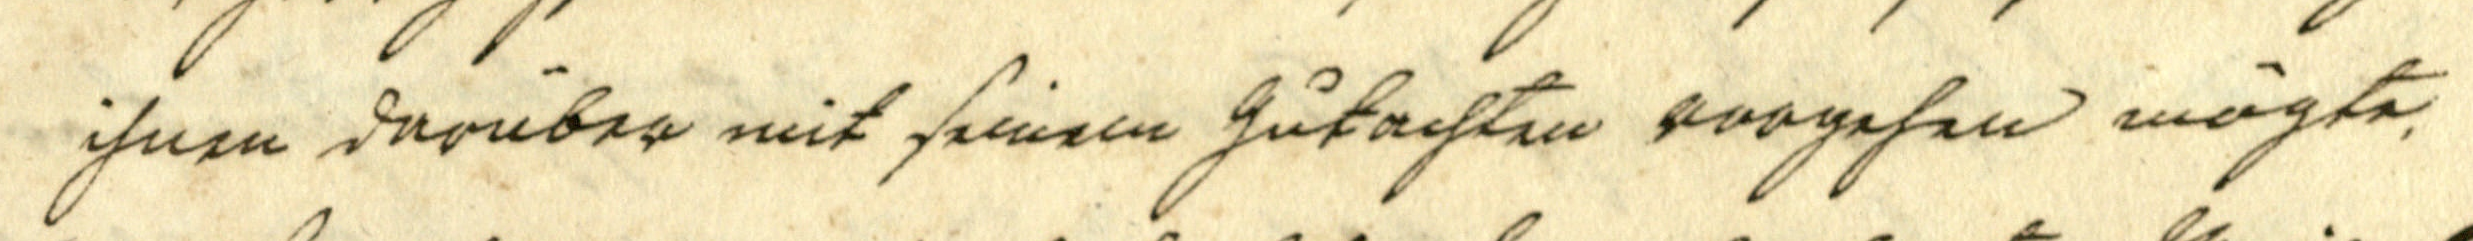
ihnen darüber mit seinem Gutachten vorgehen mögte,
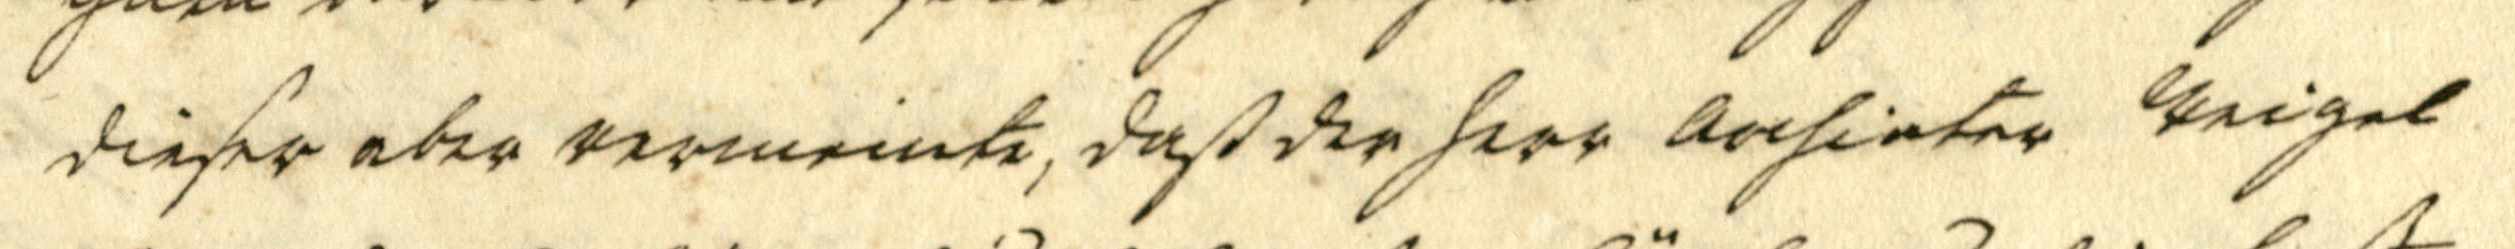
dieser aber vermeinte, daß der Herr Archiater Weigel
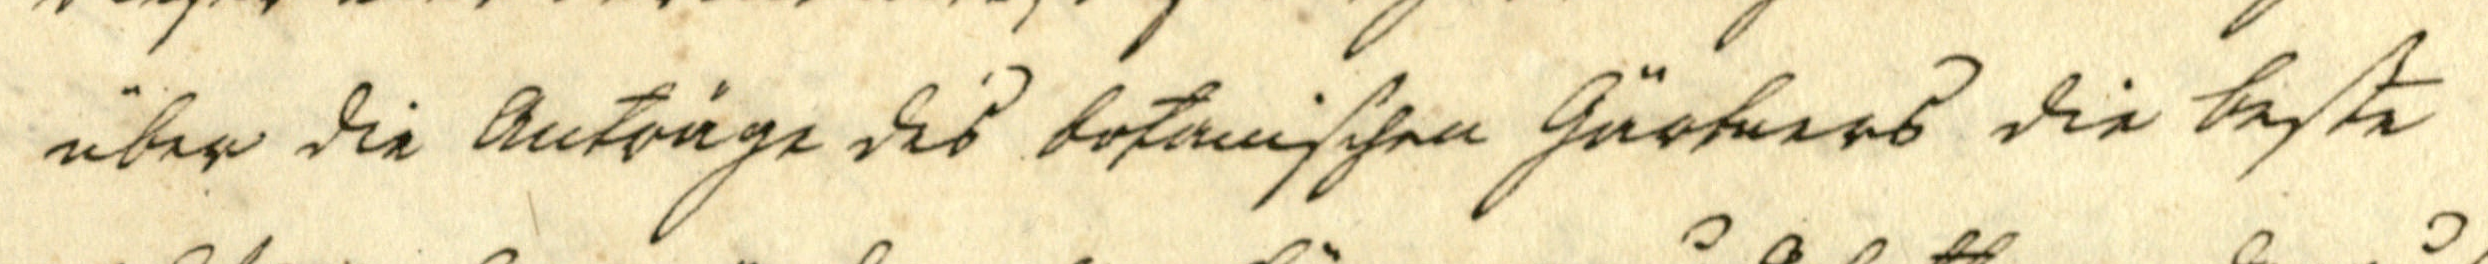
über die Anträge des botanischen Gärtners die beste
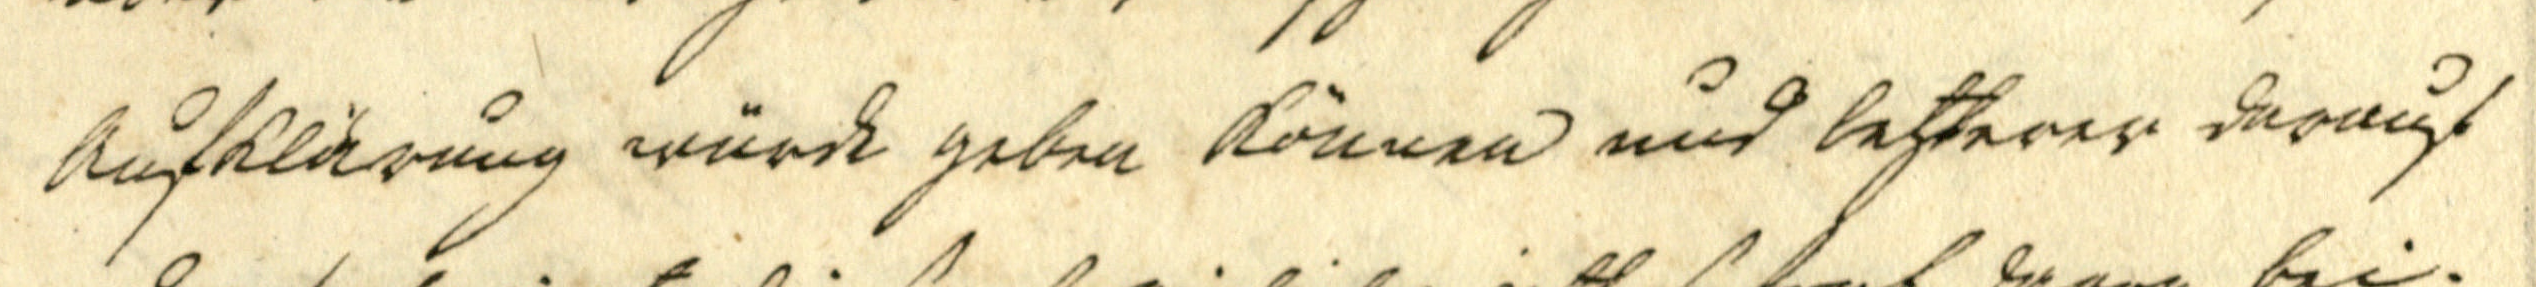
Aufklärung würde geben können und letzterer darauf
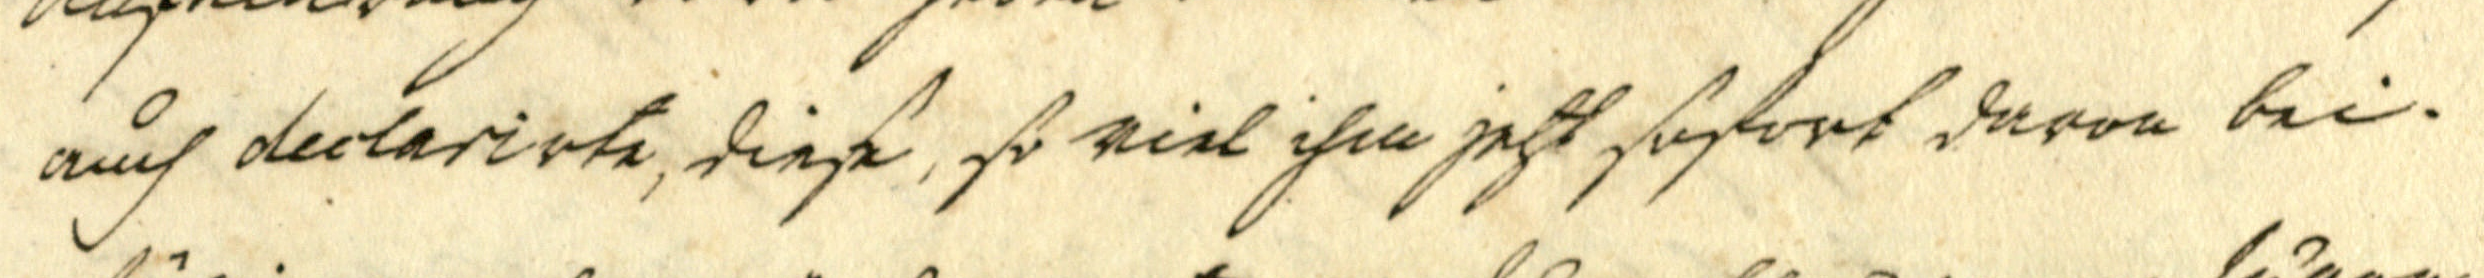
auch declarirte, diese, so viel ihm jetzt sofort davon bei¬
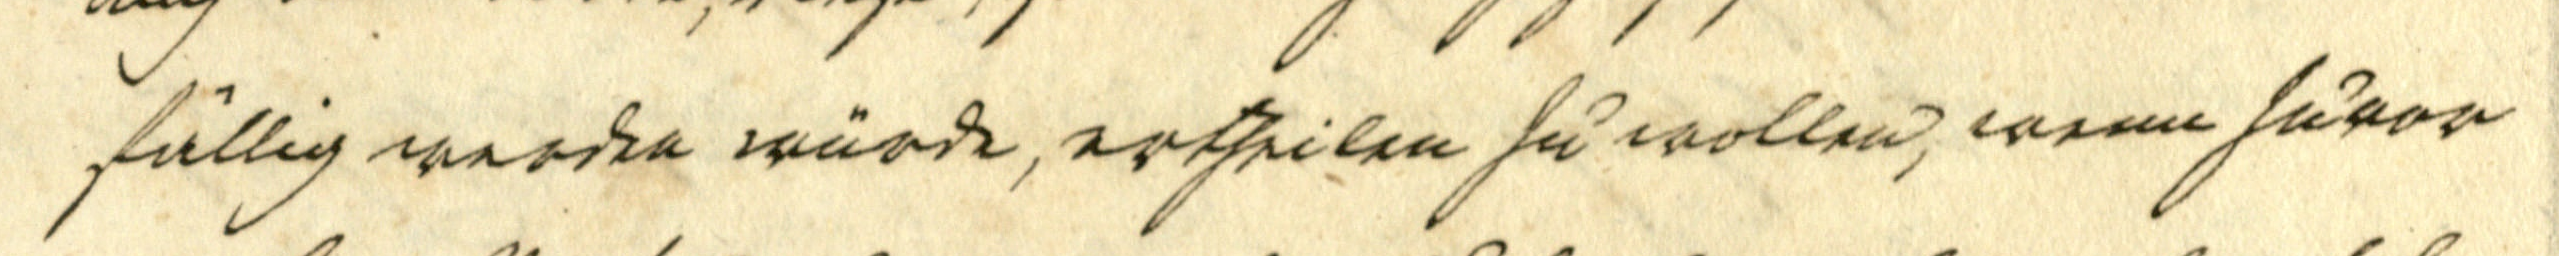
fällig werden würde, ertheilen zu wollen, wenn zuvor
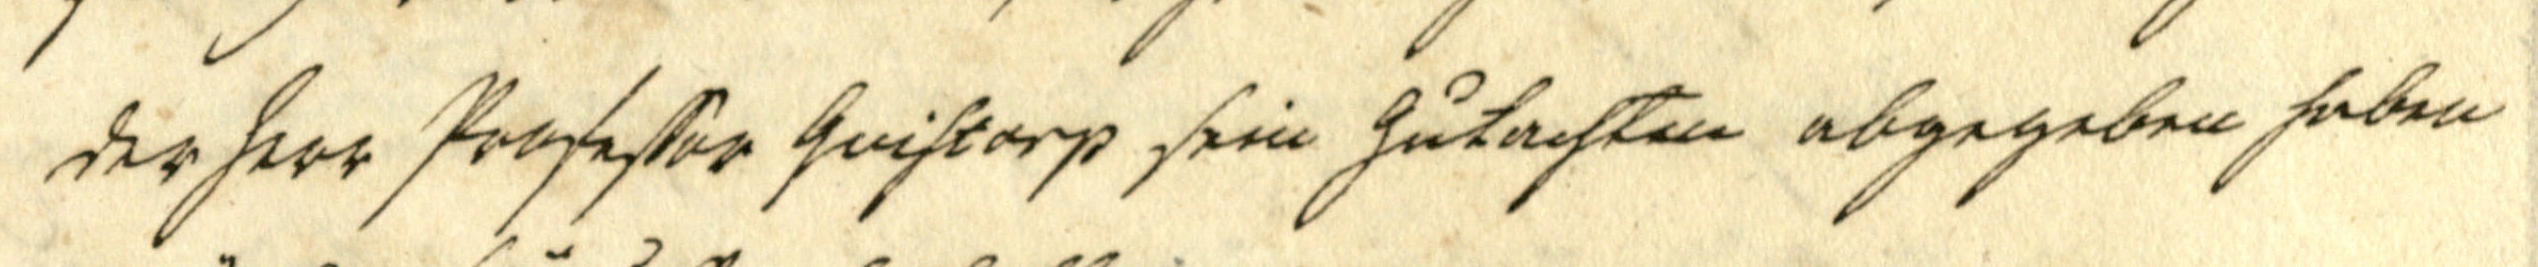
der Herr Professor Quistorp sein Gutachten abgegeben haben
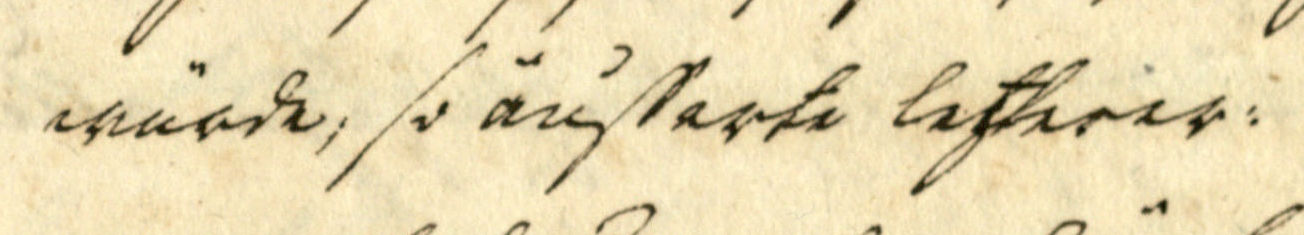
würde, so äusserte letzterer:
